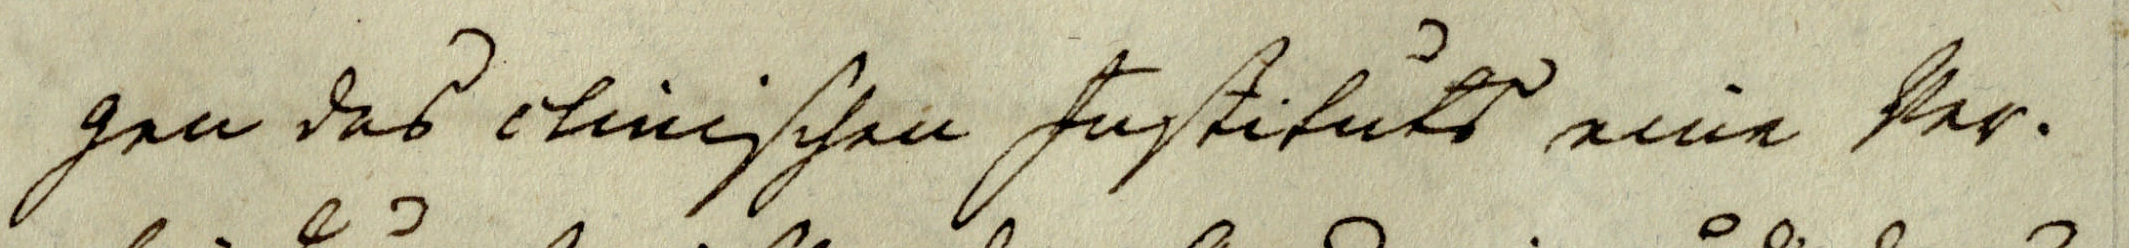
gen das clinischen Instituts eine Ver¬
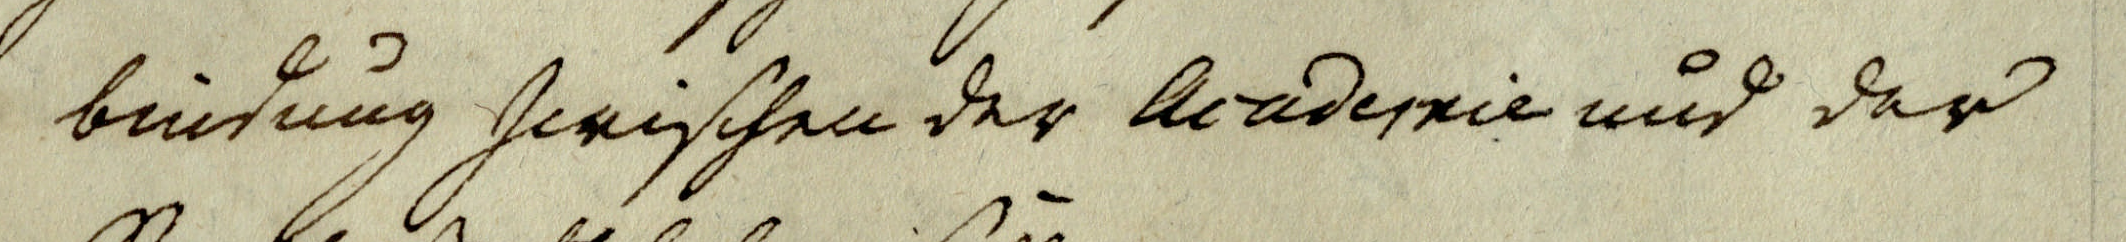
bindung zwischen der Academie und der
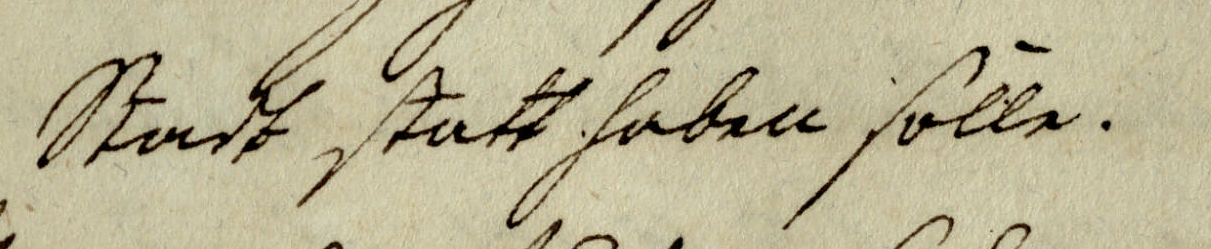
Stadt statt haben solle.
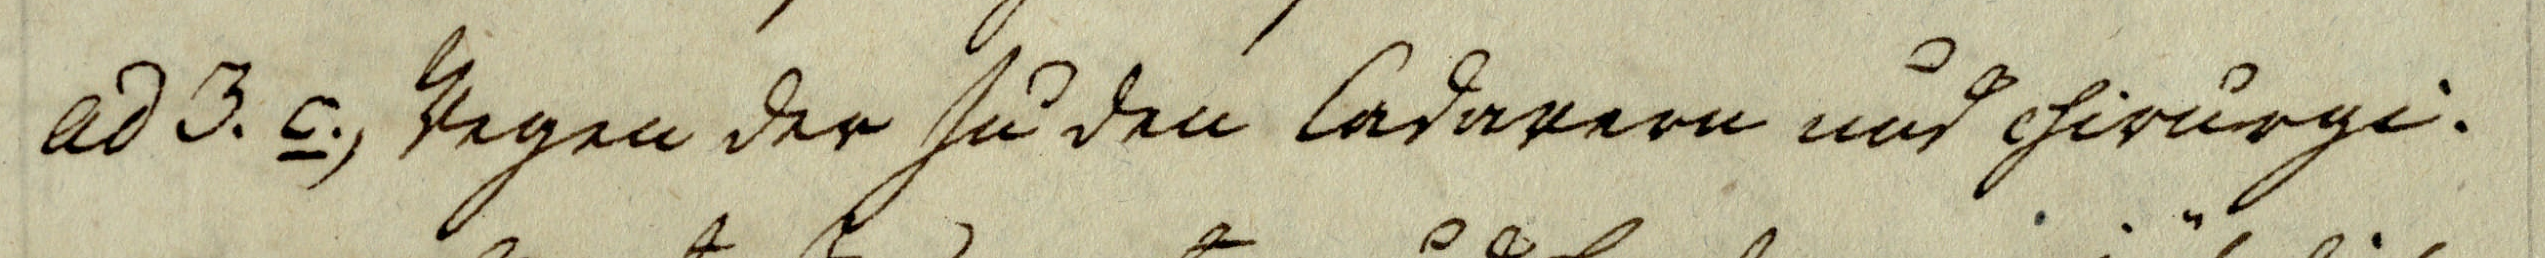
ad 3. c., Wegen der zu den Cadavern und chirurgi¬
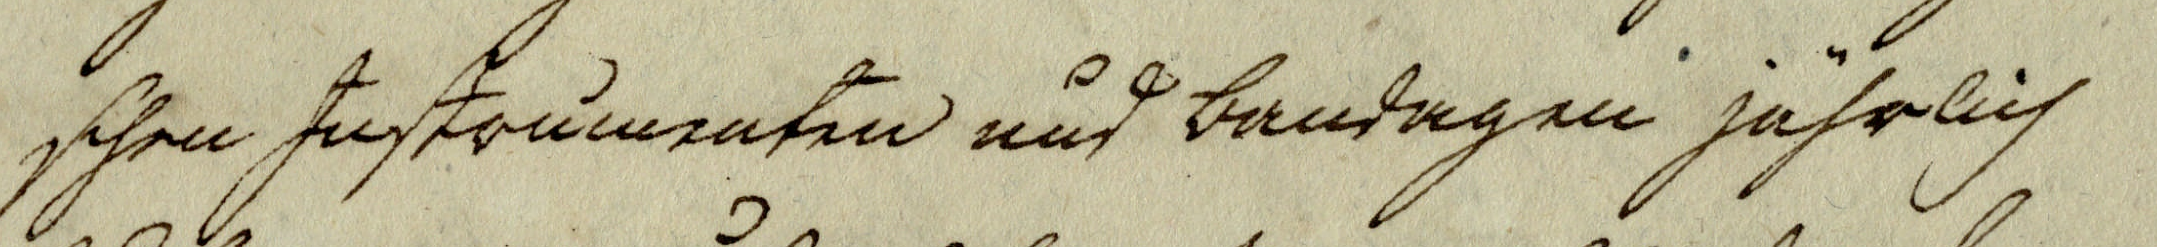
schen Instrumenten und Bandagen jährlich
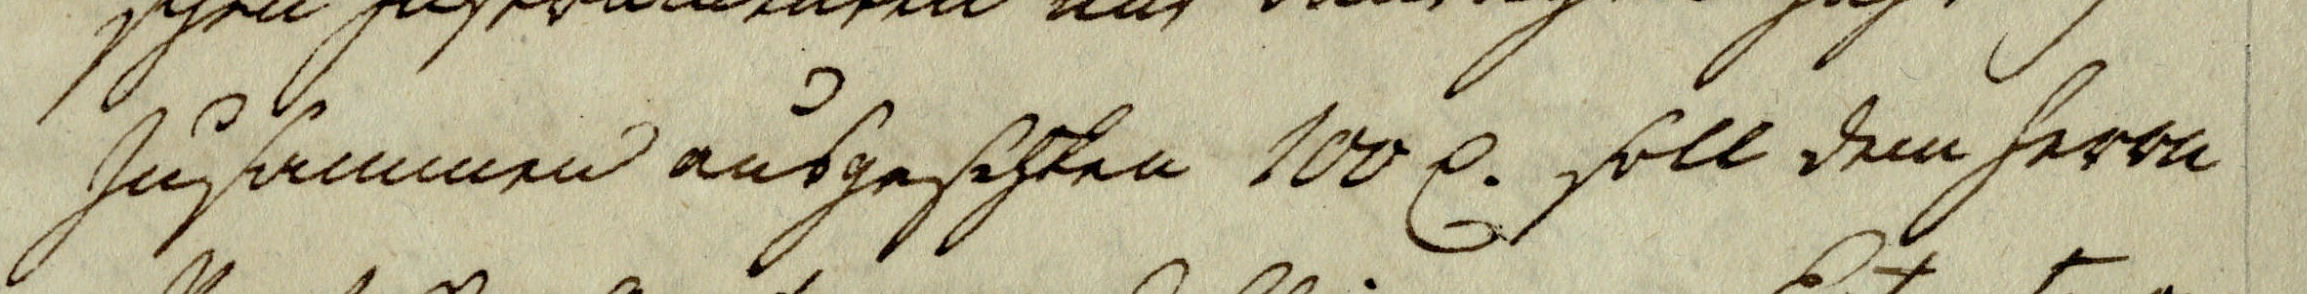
zusammen ausgesetzten 100 l. soll dem Herrn
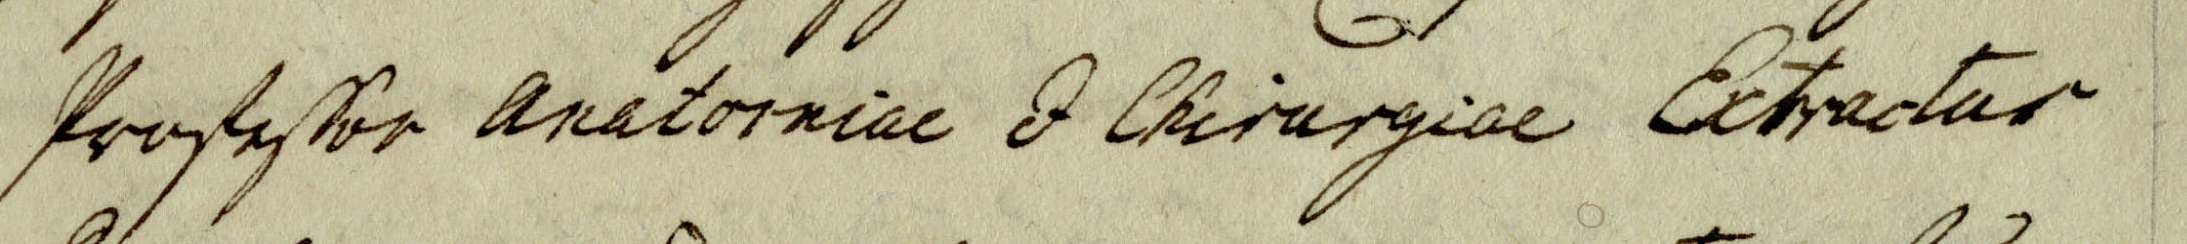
Professor Anatomiae et chirurgiae Extractus
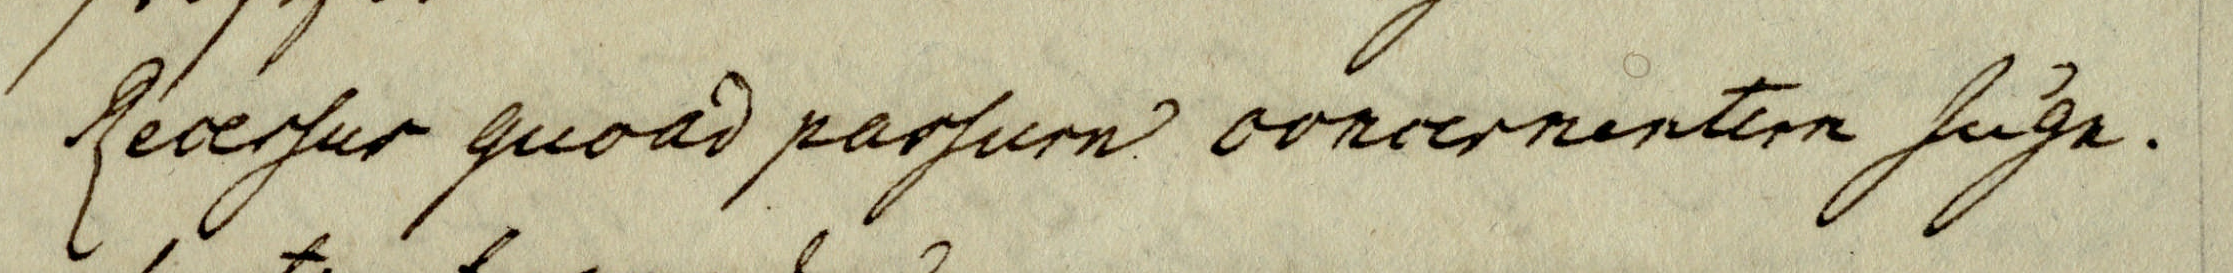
Recessus quoad passum concernentem zuge¬
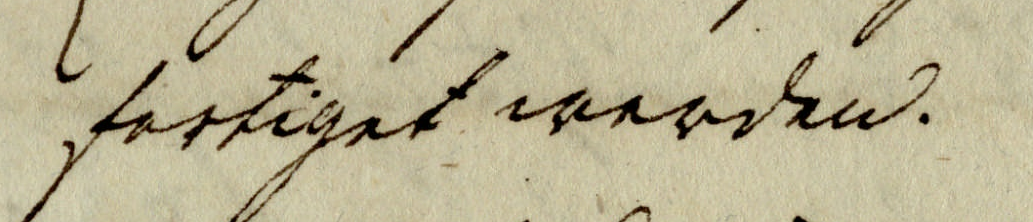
fertiget werden.
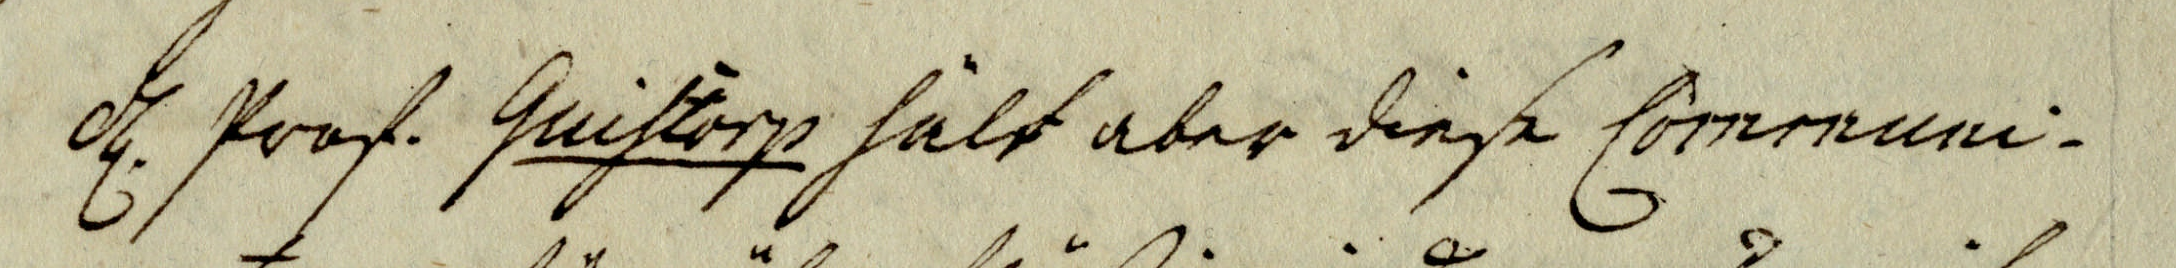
dh. Prof. Quistorp hält aber diese Communi¬
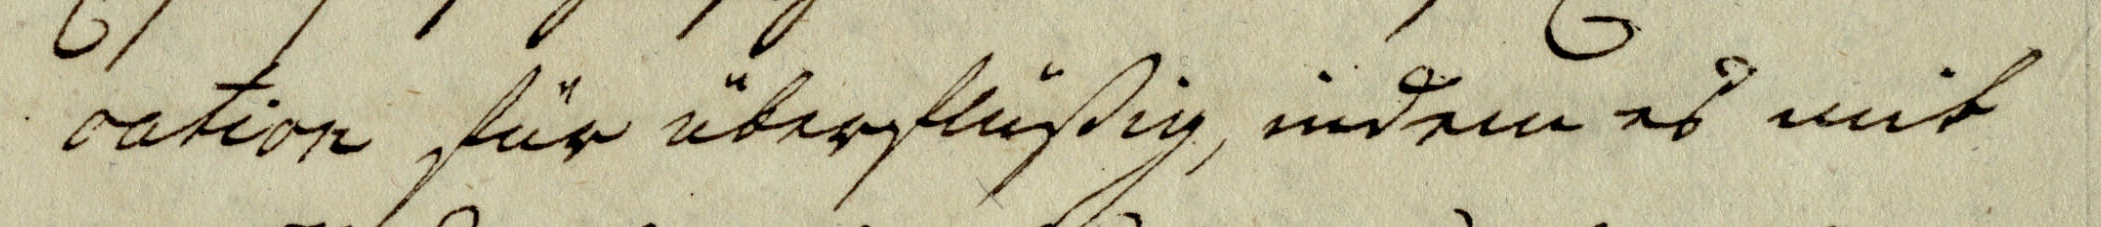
cation für überflüssig, indem es mit
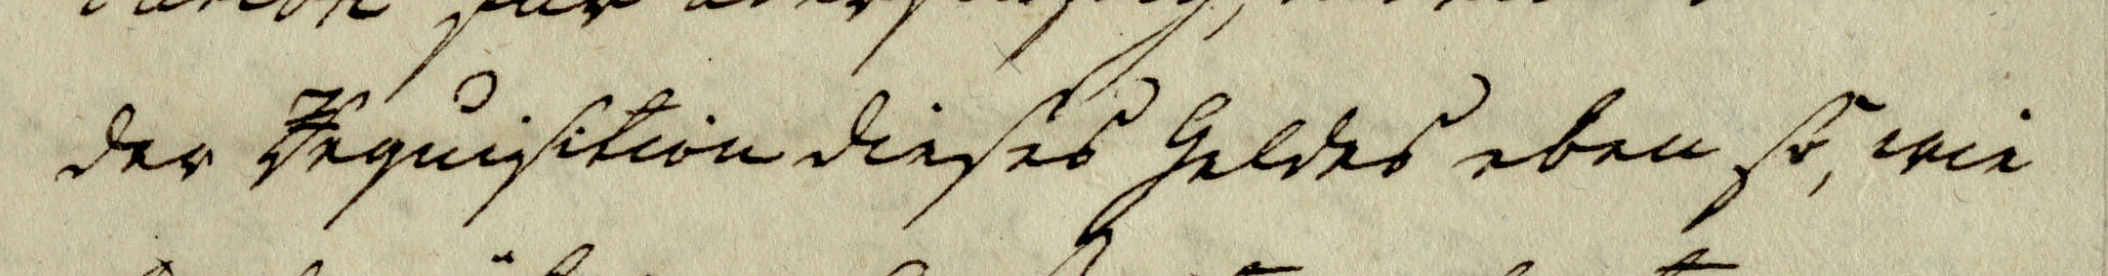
der Requisition dieses Geldes eben so, wie
